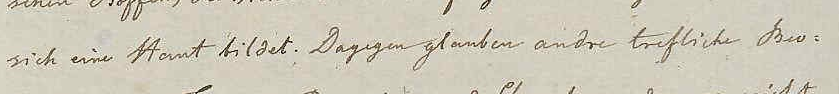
sich eine Haut bildet. Dagegen glauben andre trefliche Beo-
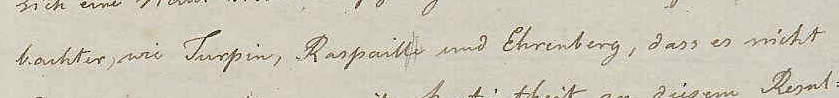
bachter, wie Turpin, Raspaille und Ehrenberg, dass es nicht
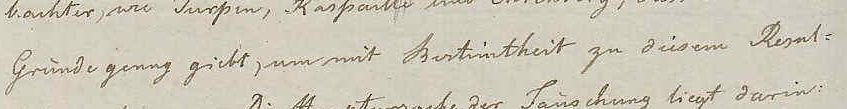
Gründe genug giebt, um mit Bestimtheit zu diesem Resul-
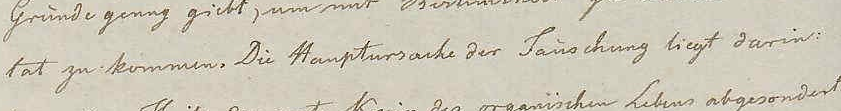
tat zu kommen. Die Hauptursache der Täuschung liegt darin:
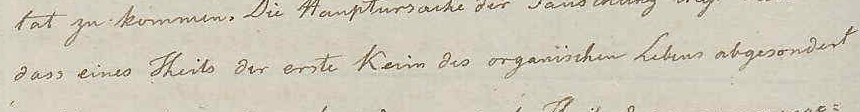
dass eines Theils der erste Keim des organischen Lebens abgesondert
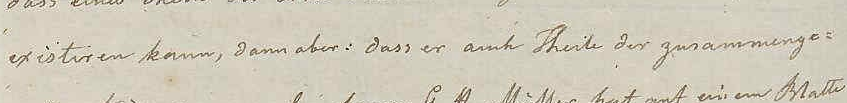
existiren kann, dann aber: dass er auch Theile der zusammenge-
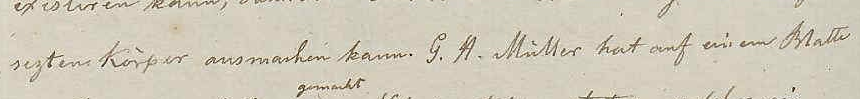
sezten Körper ausmachen kann. G. A. Müller hat auf einem Blatte
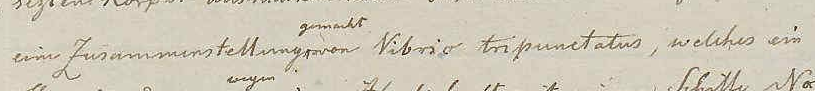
eine Zusammenstellung gemacht von Vibrio tripunctatus, welches ein
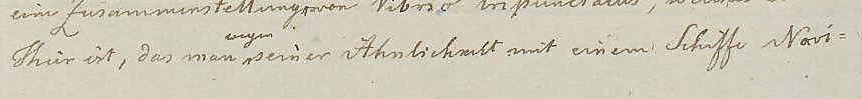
Thier ist, das man wegen seiner Ähnlichkeit mit einem Schiffe Noavi-
